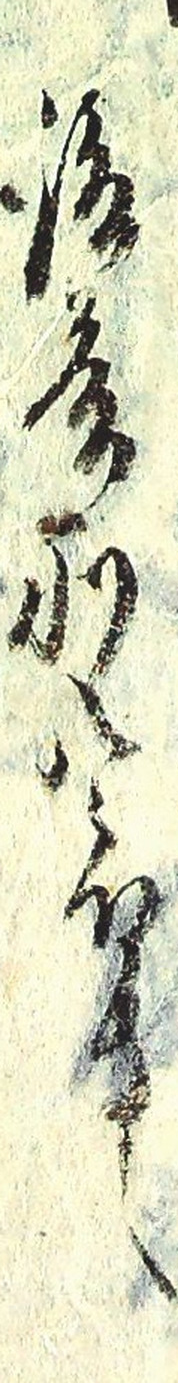後藤利八郎方へ
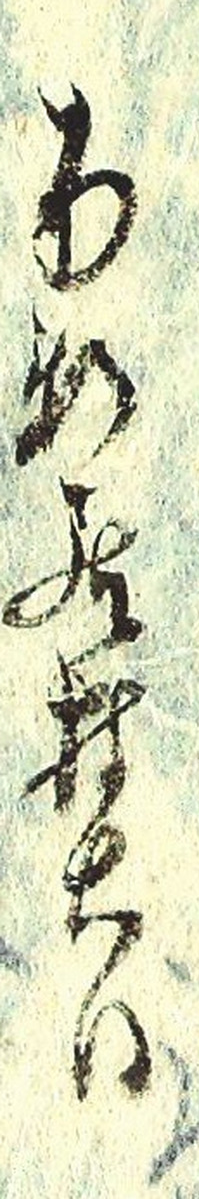南新居村右同
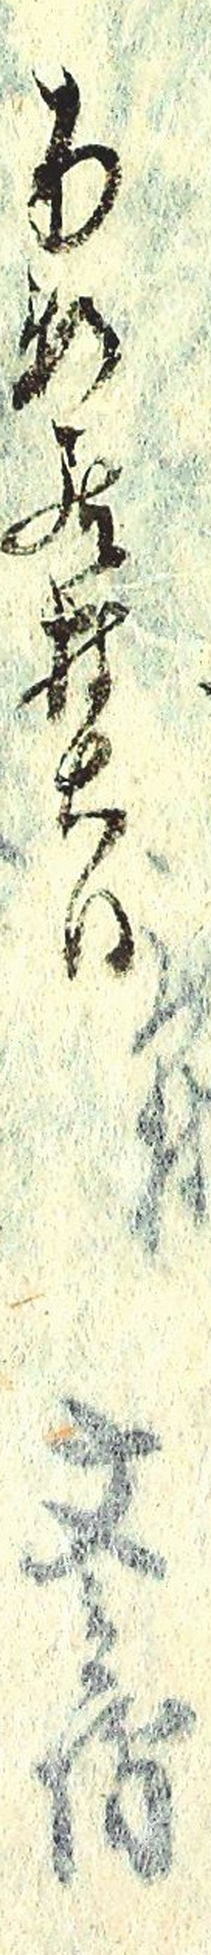南新居村右同
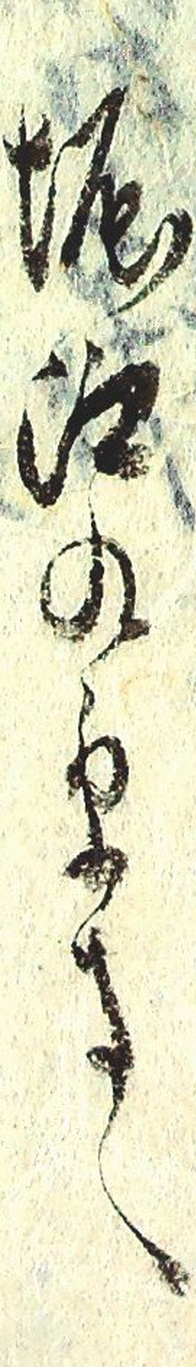堀江九兵衛方へ

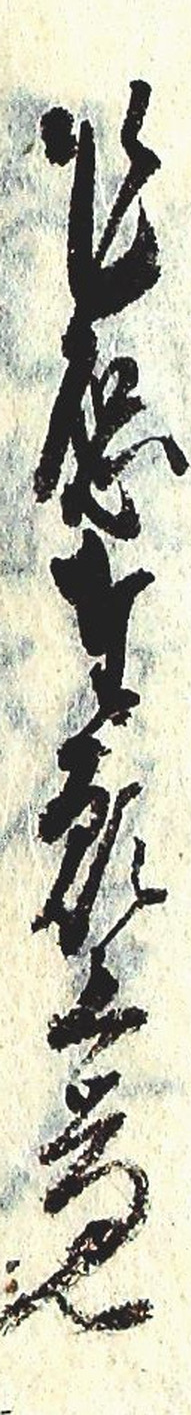乍恐奉願上覚
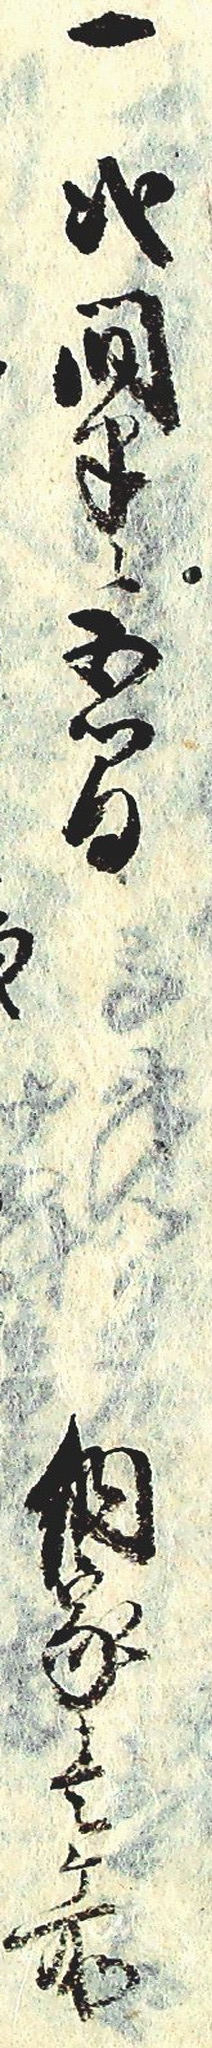一弐間半に五間納家壱ヶ所
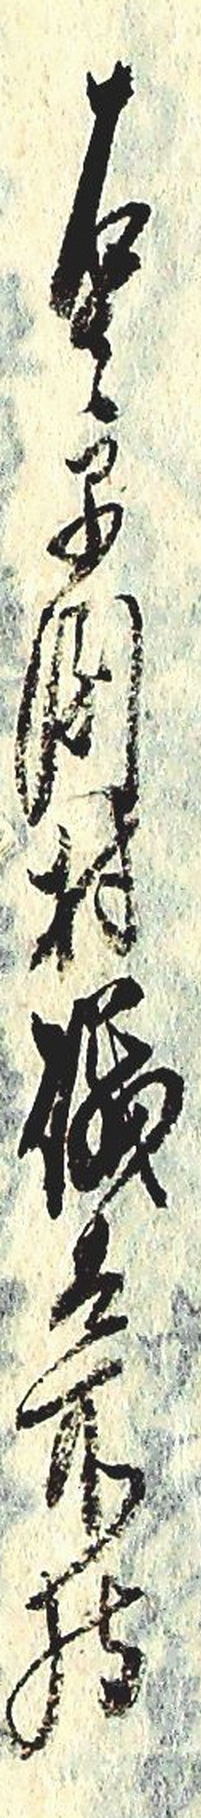右は早淵村磯太所持
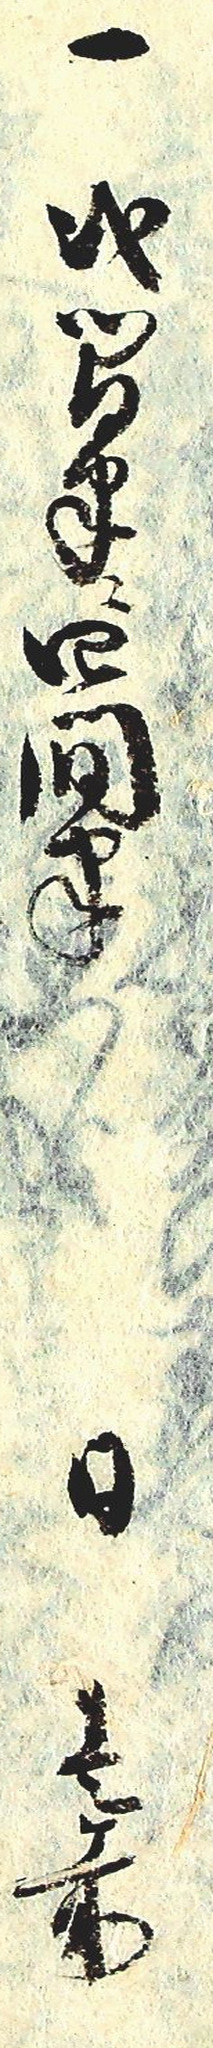一弐間半に四間半同壱ヶ所
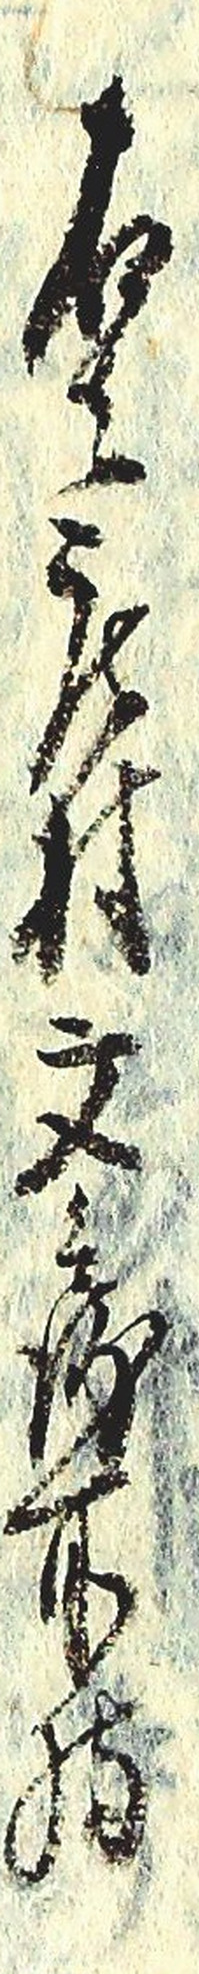右は庄村文兵衛所持
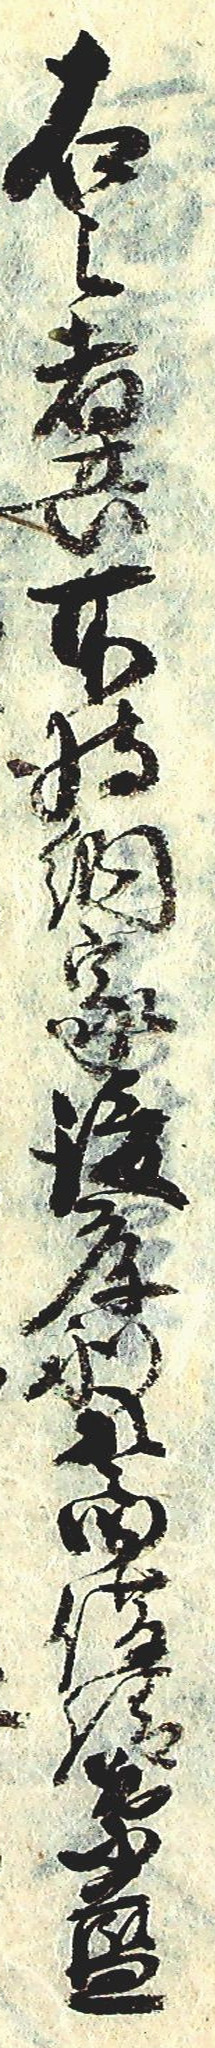右之者共所持納家後藤利八郎借請葉藍
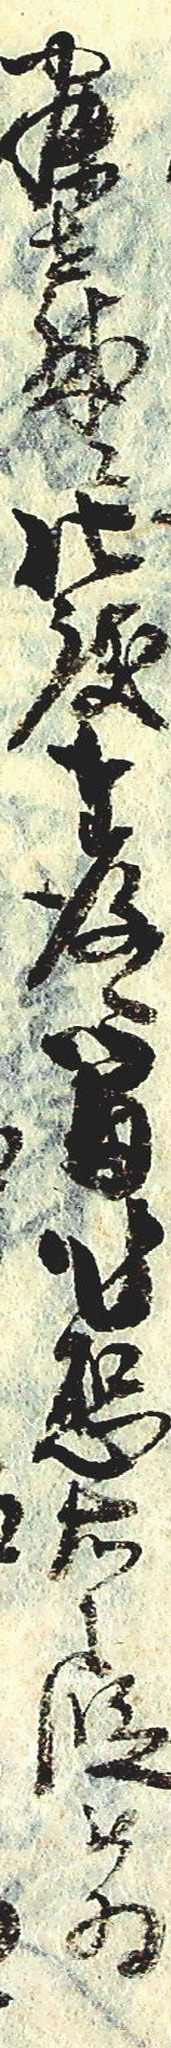寐せ床に仕度奉存候間乍恐右之段被為
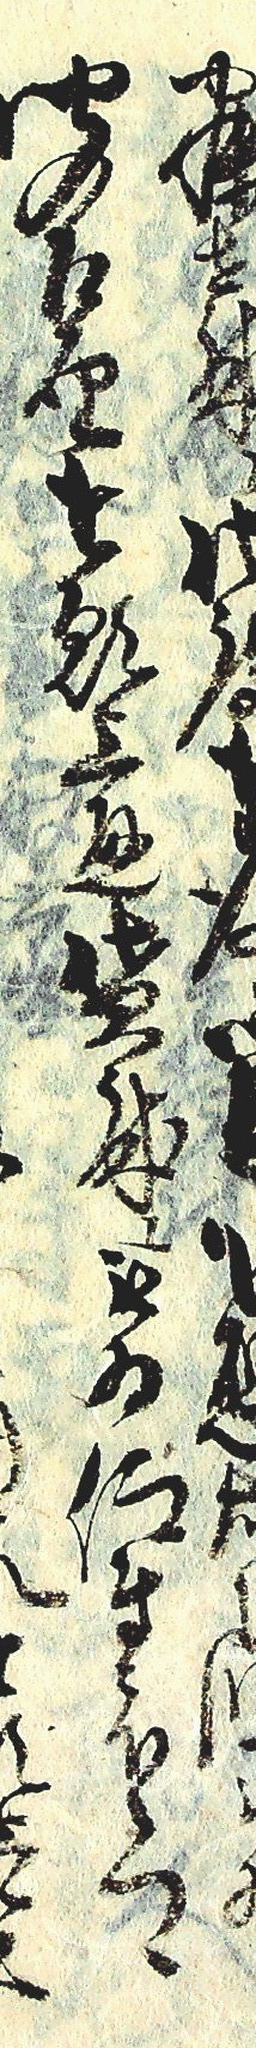聞召届奉願上通貸床に被為仰付被下候はゝ
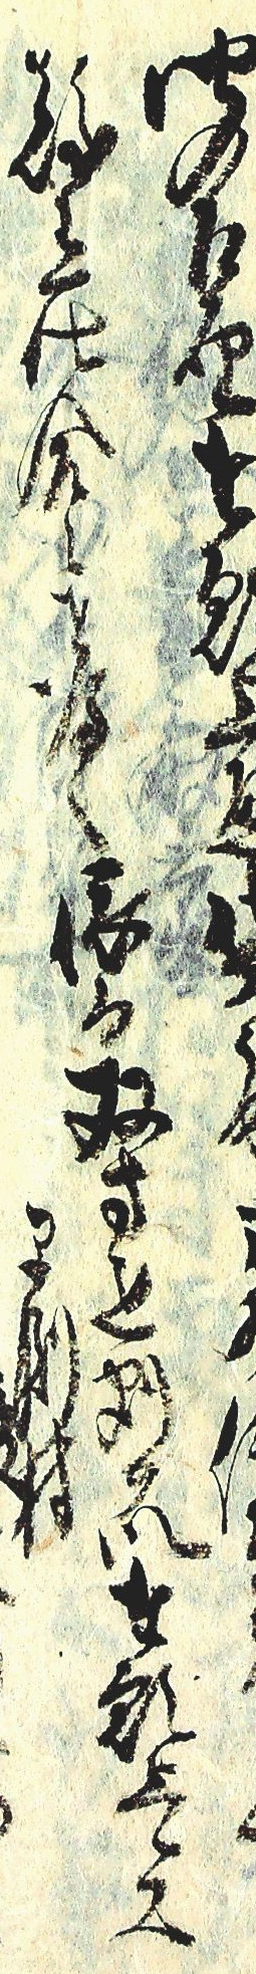難有仕合に奉存候依て双方連判を以奉願上候以上
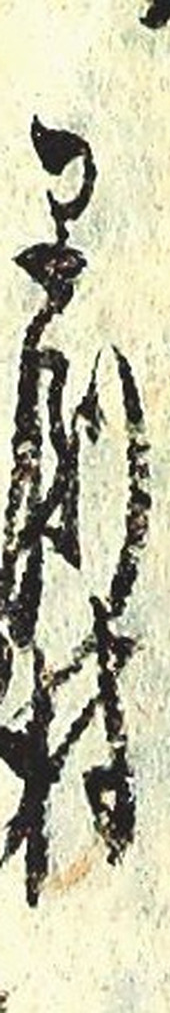早淵村
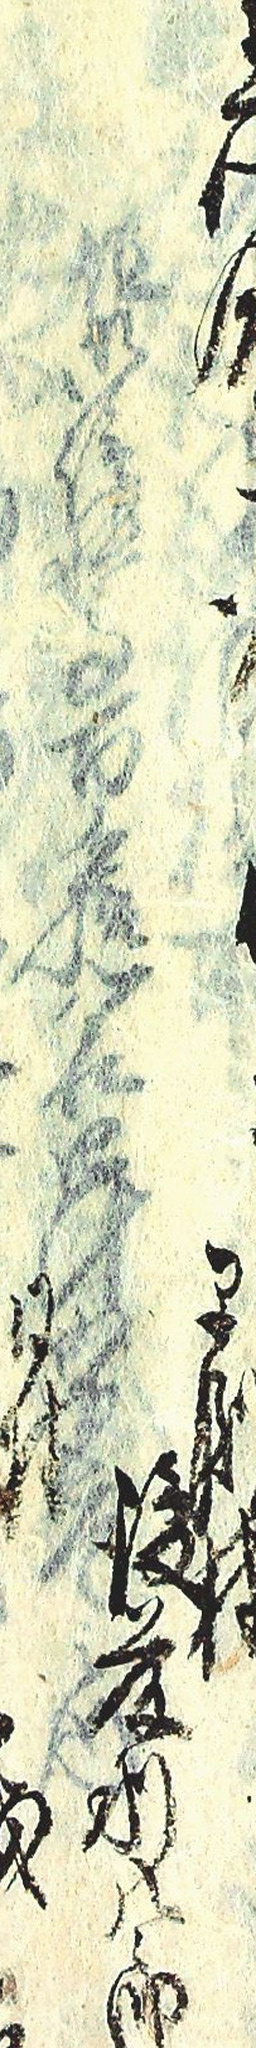後藤利八郎
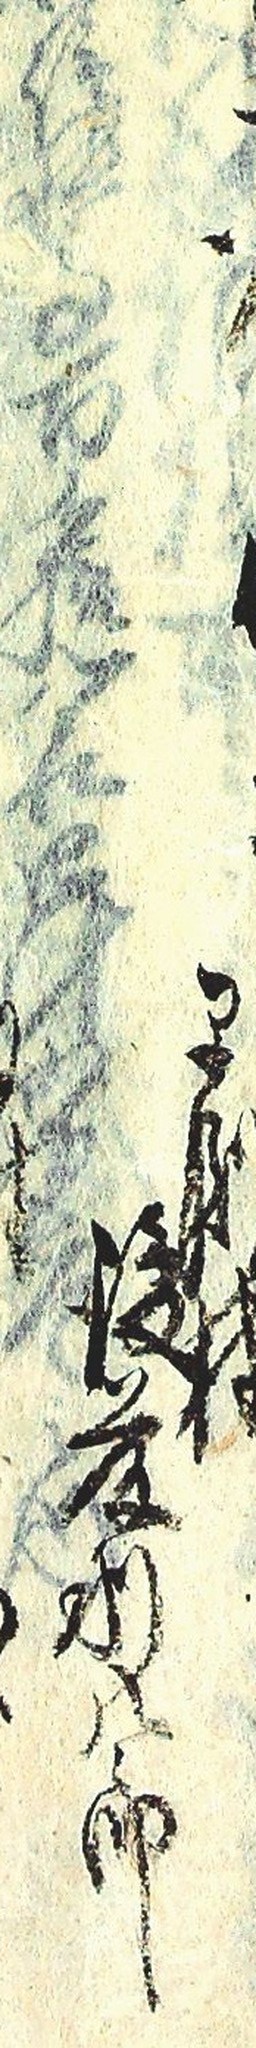後藤利八郎
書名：諸御願書控(弐番）
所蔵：鳴門教育大学 Naruto University of Education
